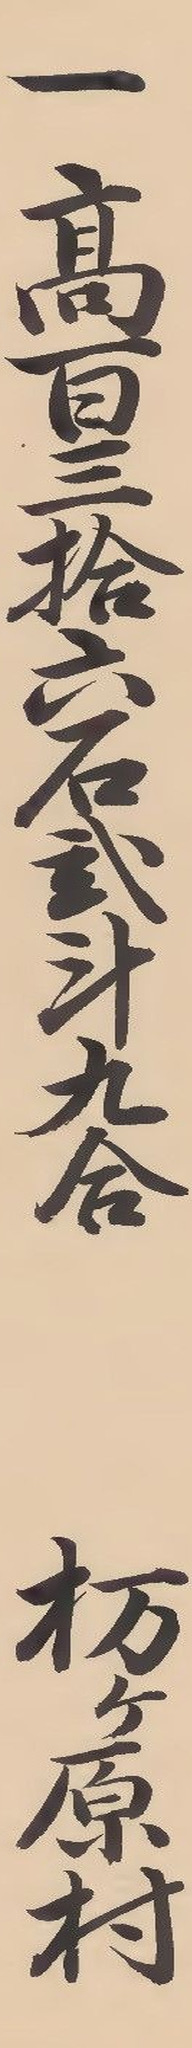一高百三拾六石弐斗九合栃ヶ原村
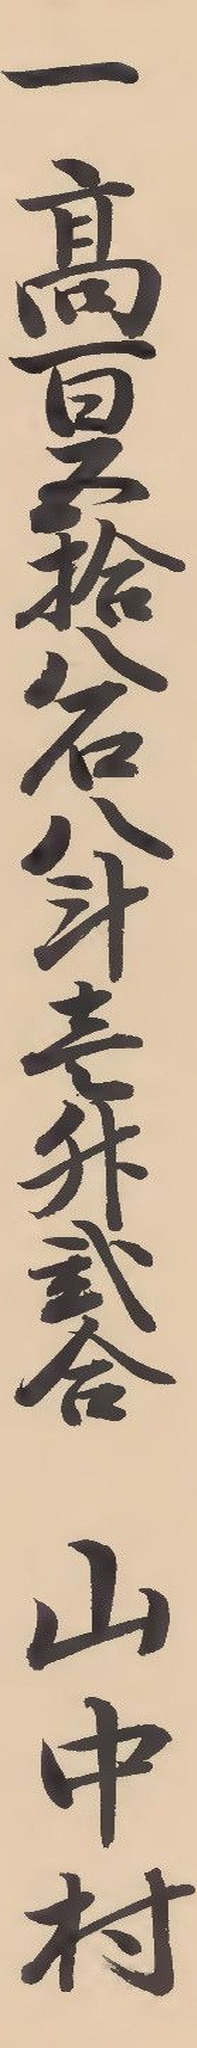一高百五拾八石八斗壱升弐合山中村
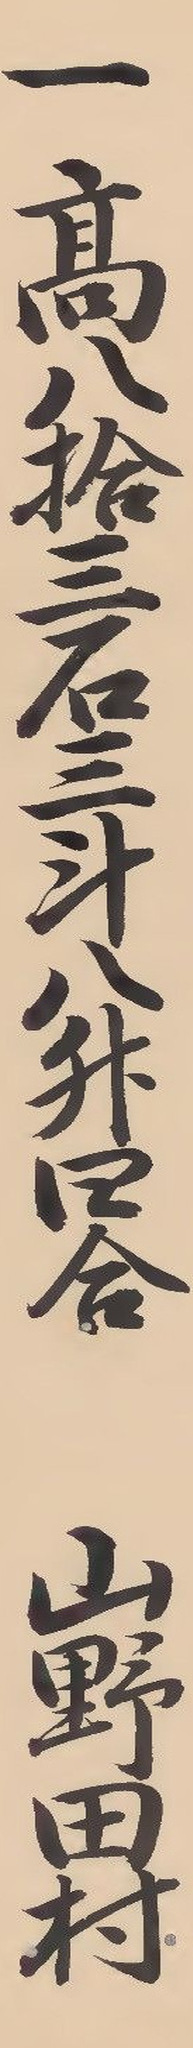一高八拾三石三斗八升四合山野田村

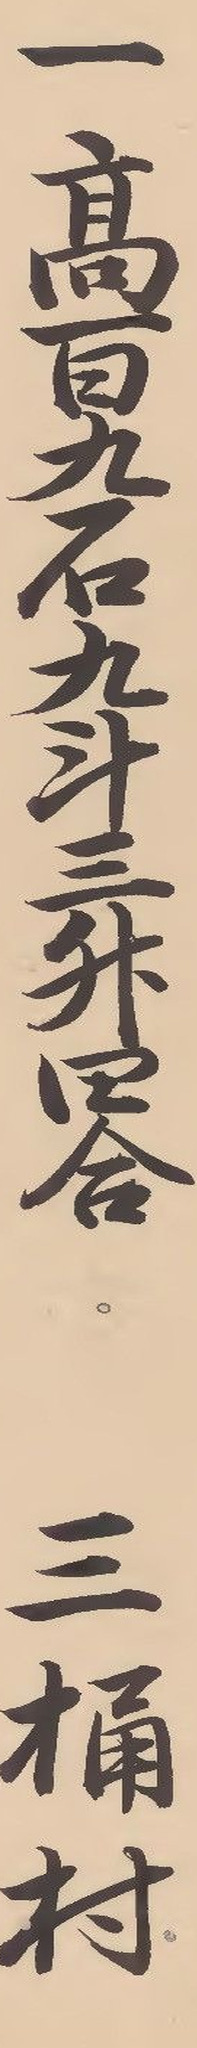一高百九石九斗三升四合三桶村
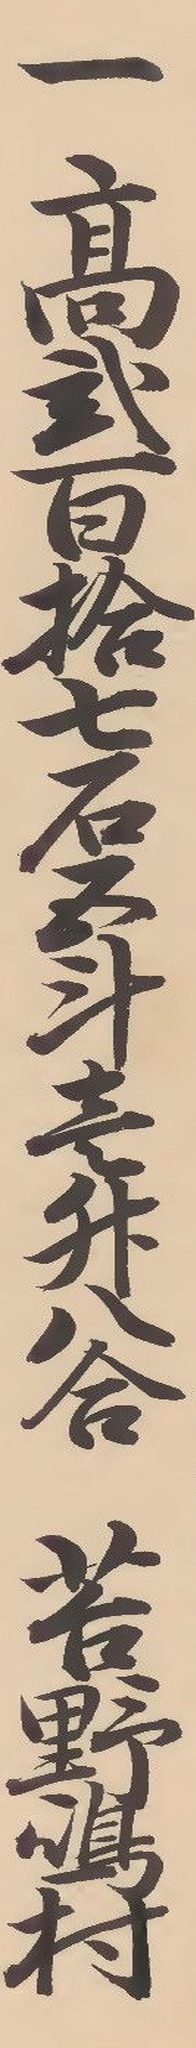一高弐百拾七石五斗壱升八合苔野島村
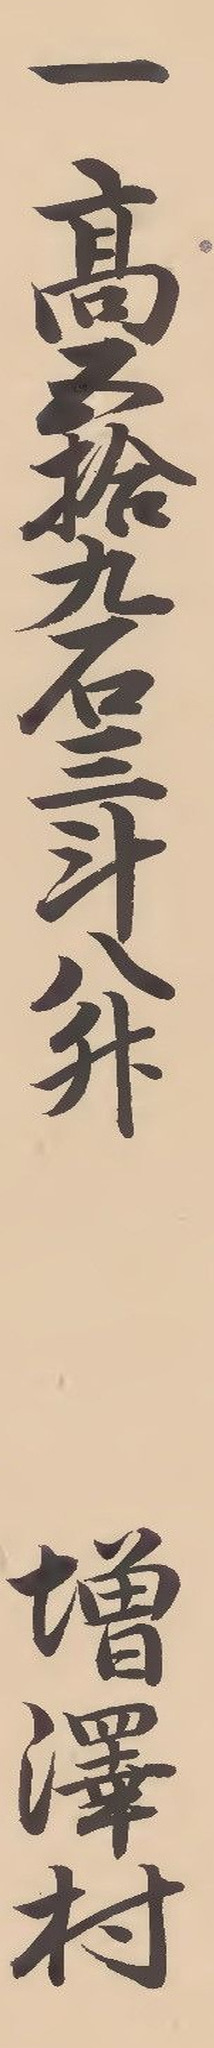一高五拾九石三斗八升増沢村
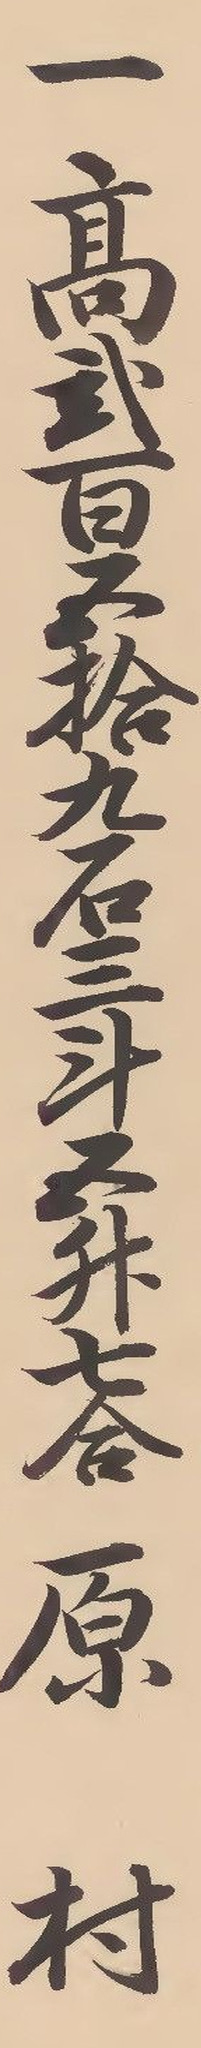一高弐百五拾九石三斗五升七合原村
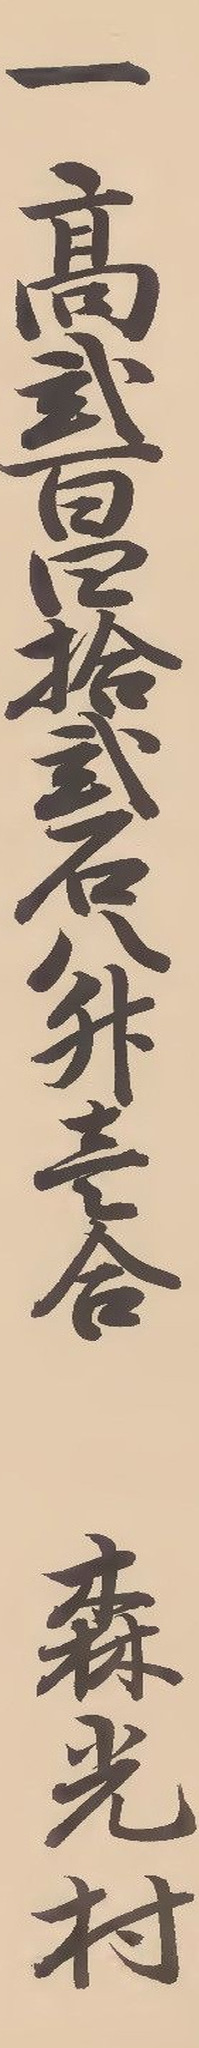一高弐百四拾弐石八升壱合森光村
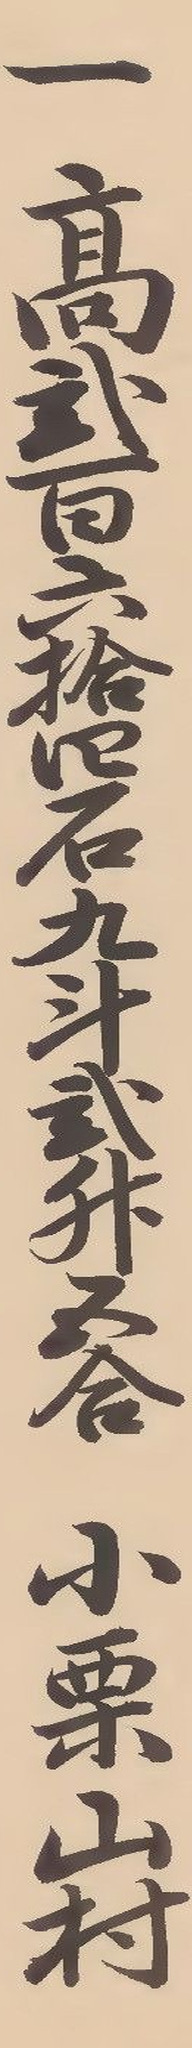一高弐百六拾四石九斗弐升五合小栗山村
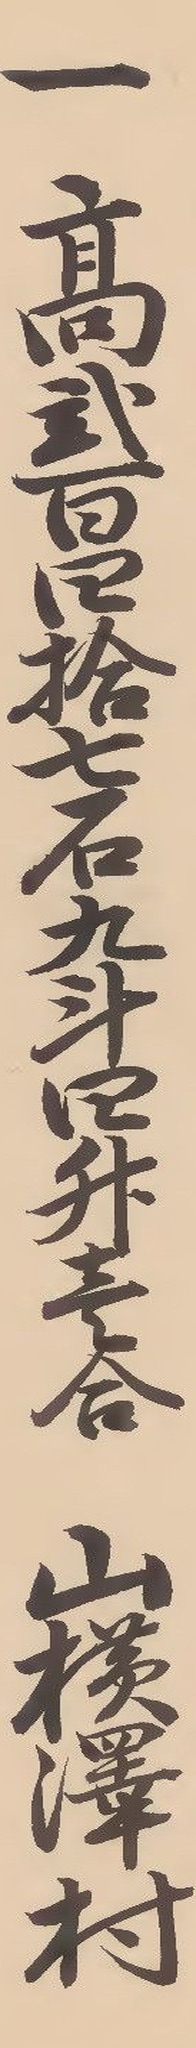一高弐百四拾七石九斗四升壱合山横沢村
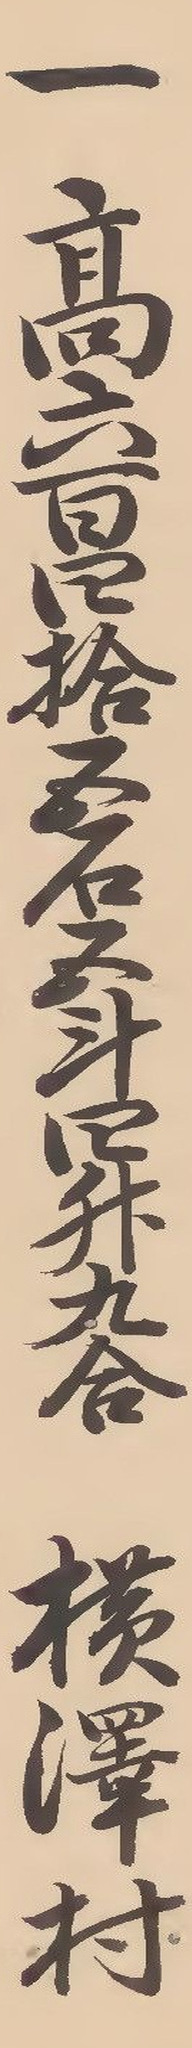一高六百四拾五石五斗四升九合横沢村

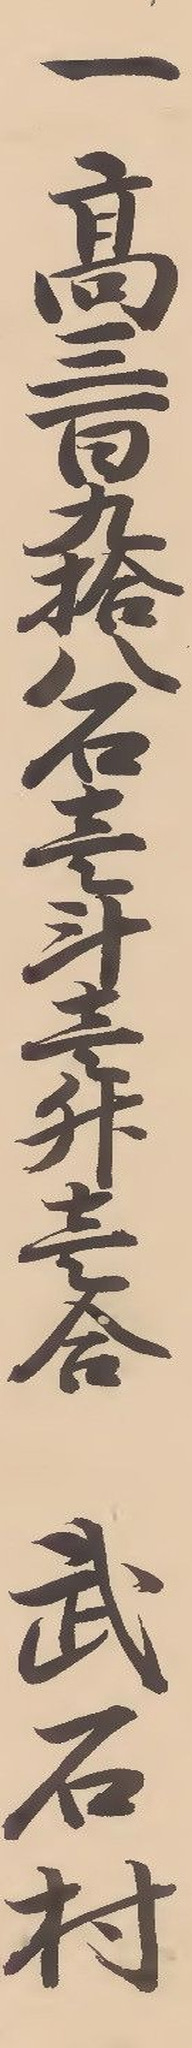一高三百九拾八石壱斗壱升壱合武石村
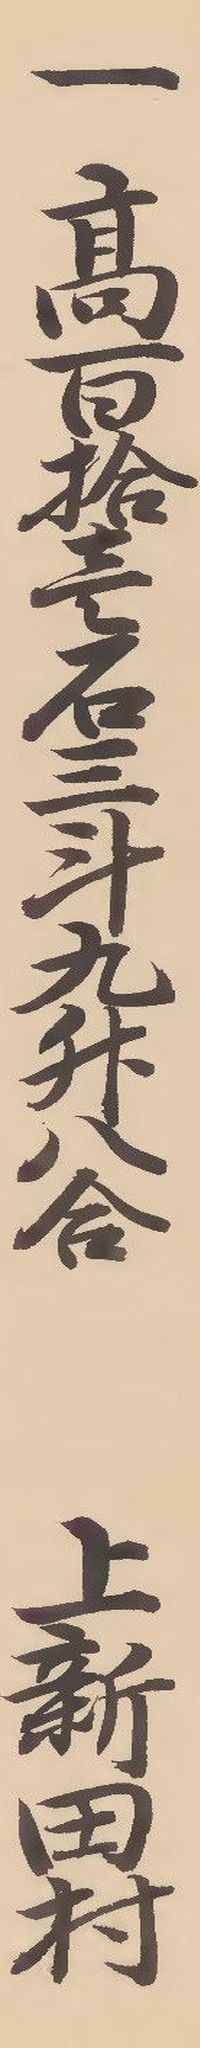一高百拾壱石三斗九升八合上新田村
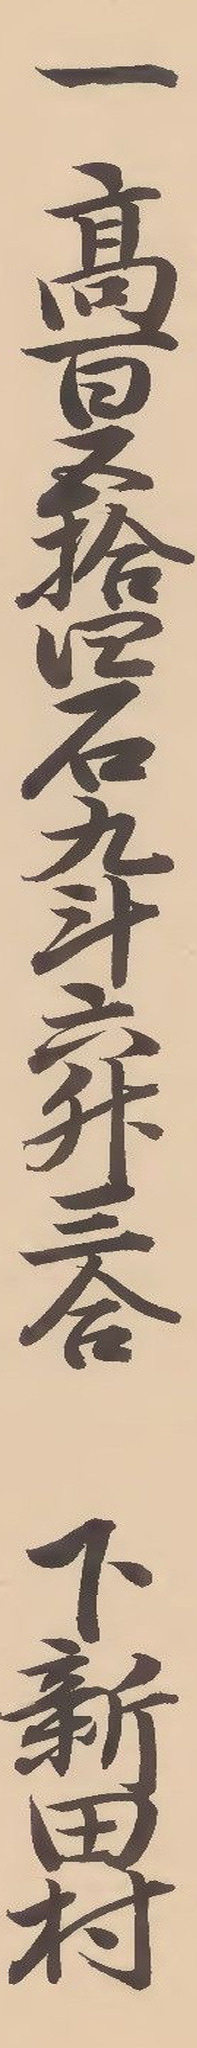一高百五拾四石九斗六升三合下新田村
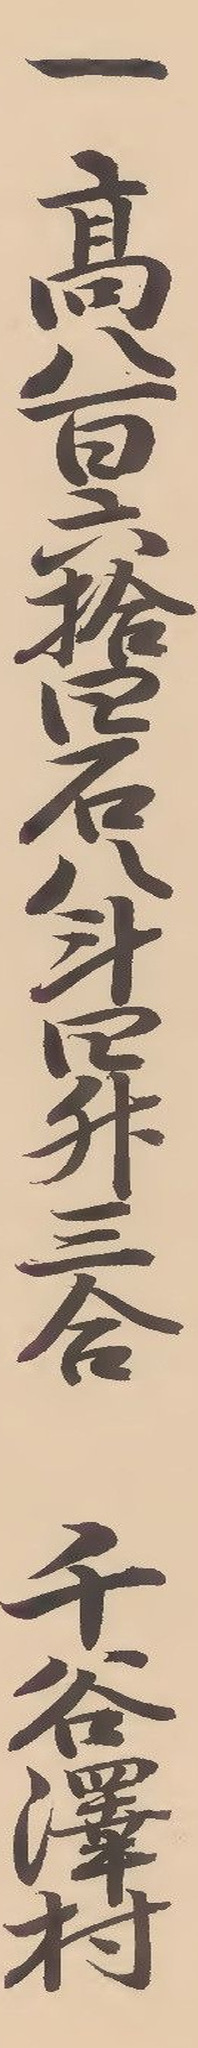一高八百六拾四石八斗四升三合千谷沢村
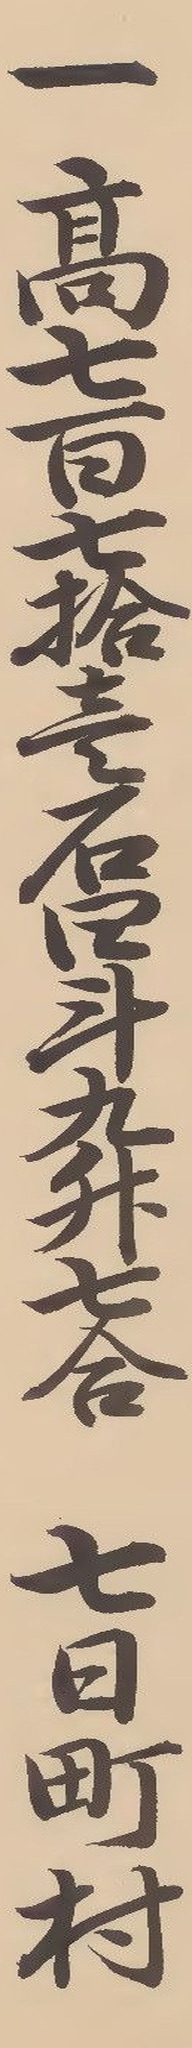一高七百七拾壱石四斗九升七合七日町村
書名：越後国郷帳　中
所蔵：国立公文書館 National Archives of Japan
